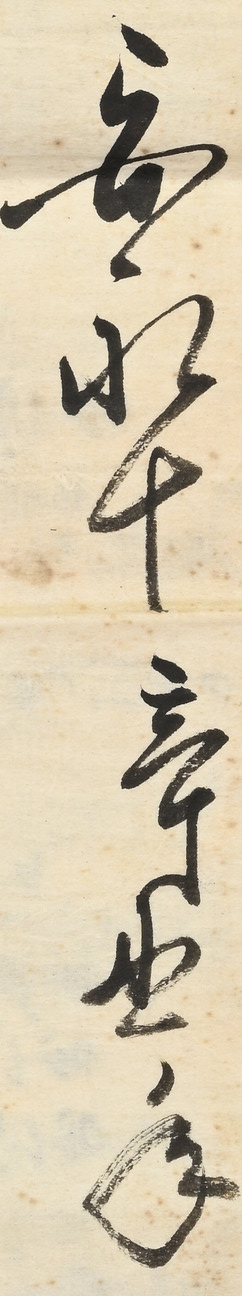安永十辛丑年
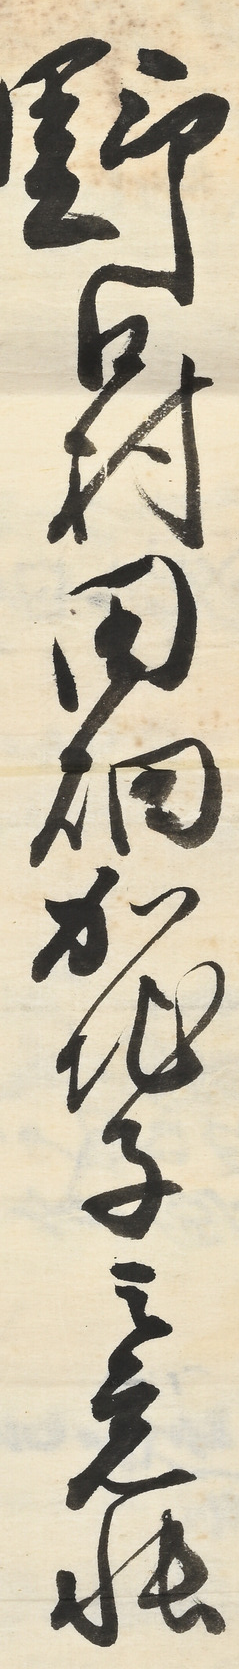野口村田畑加地子之覚帳
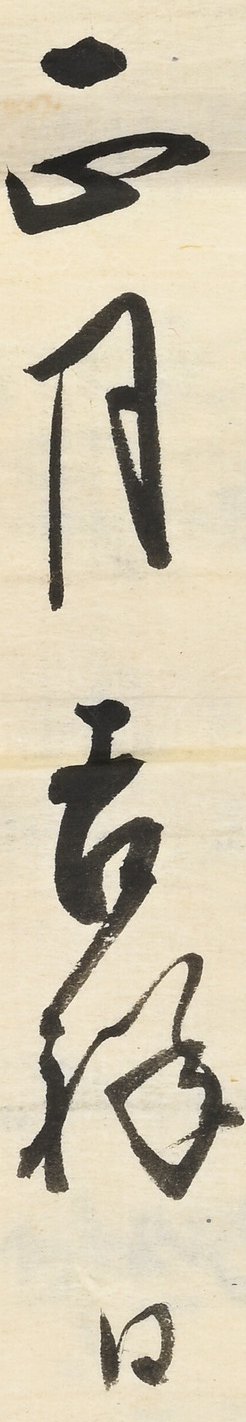正月吉祥日
